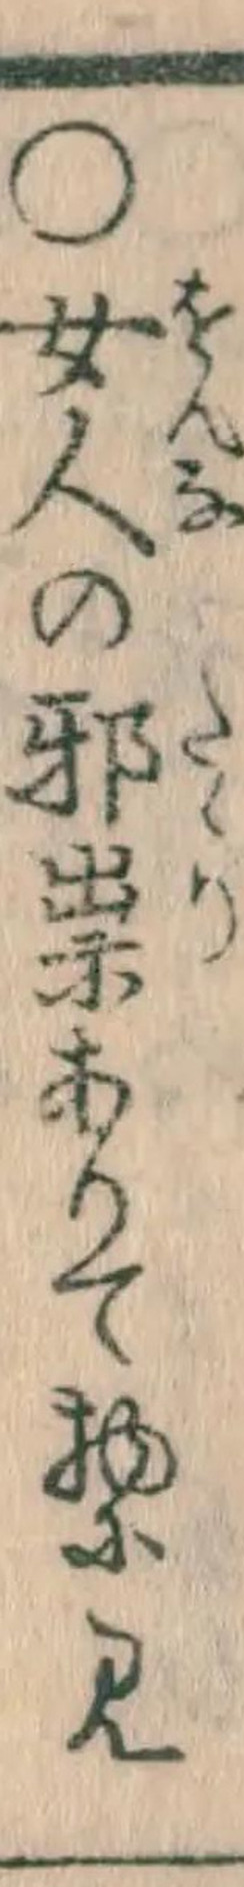○女人の邪祟ありて物に見
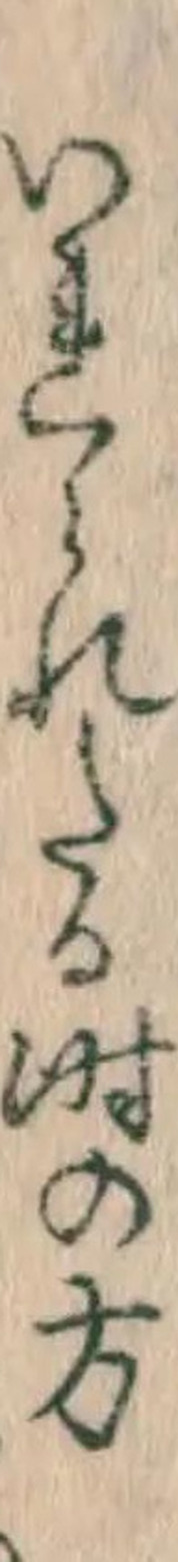いれられたる時の方
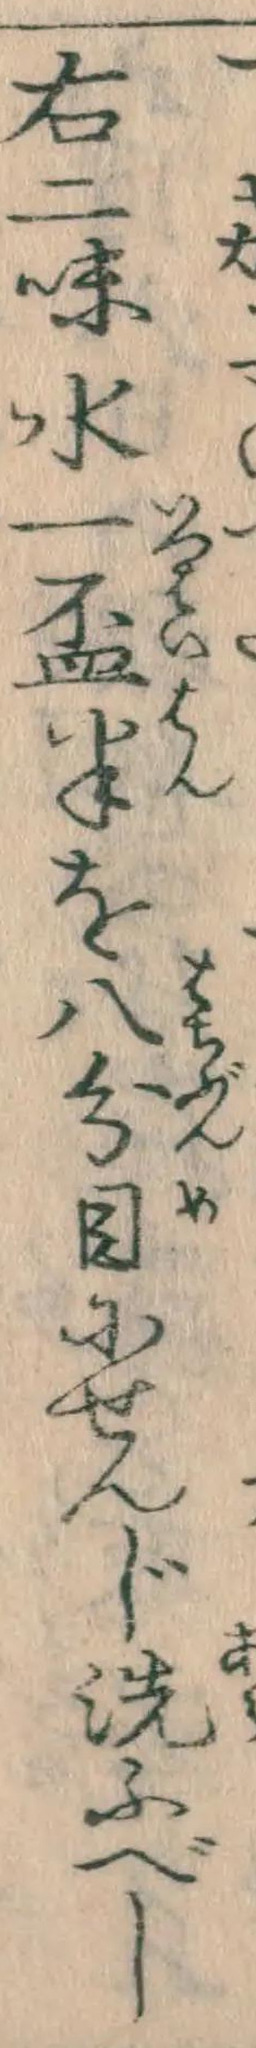右二味水一盃半を八分目にせんじ洗ふべし
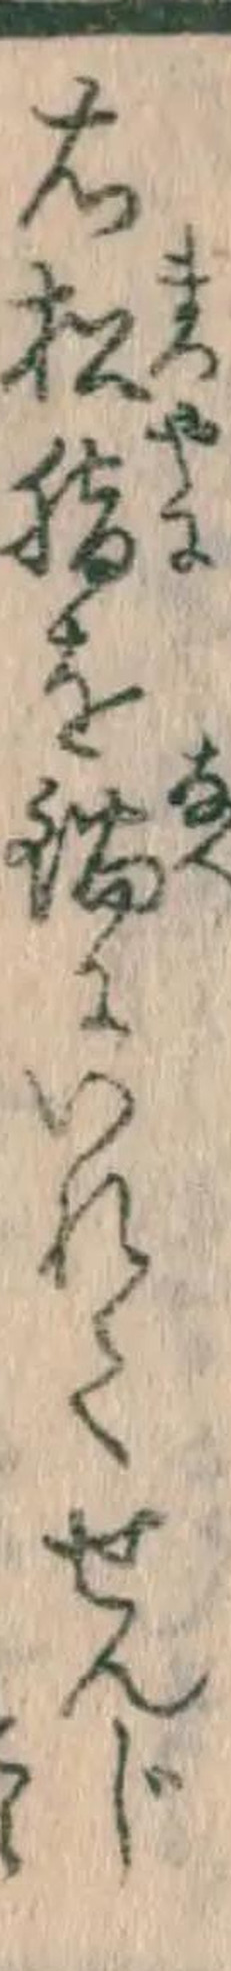右松脂を鍋にいれてせんじ
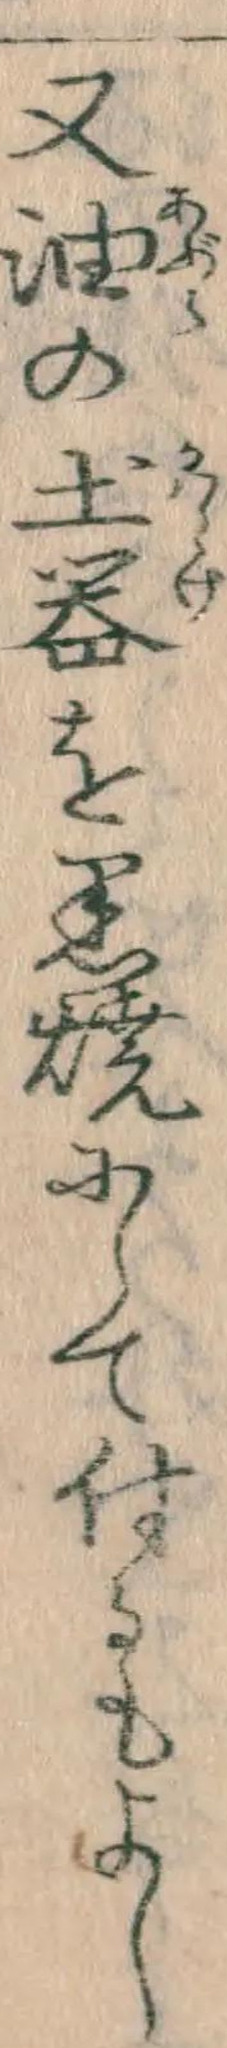又油の土器を黒焼にして付るもよし
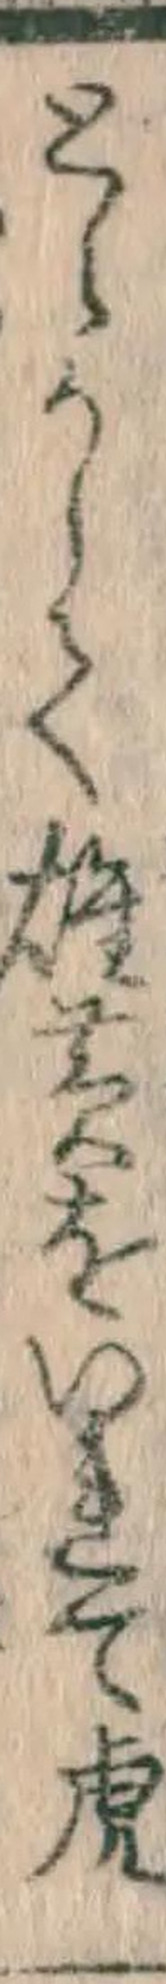とらかして雄黄をいれて虎
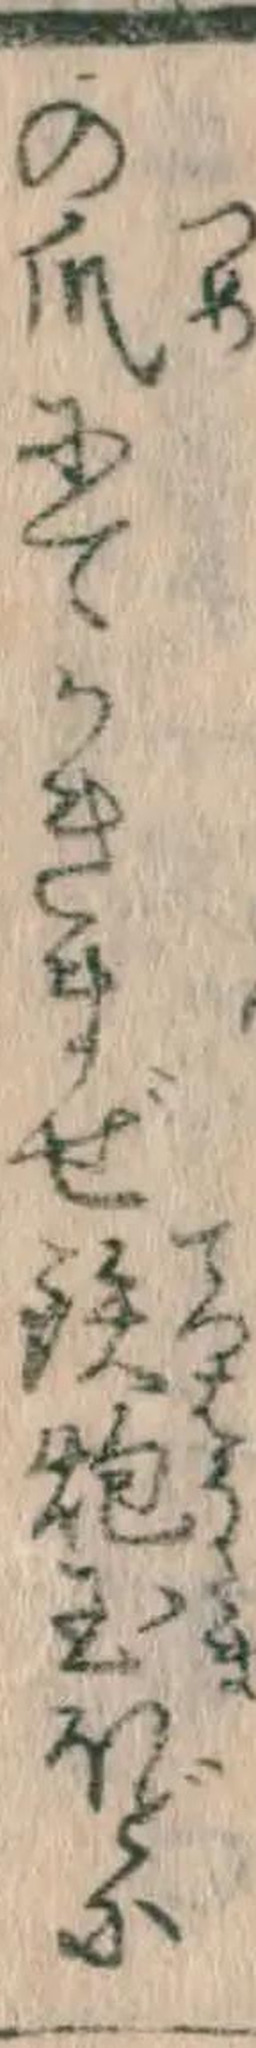の爪にてかきまぜ鉄炮玉ほどに
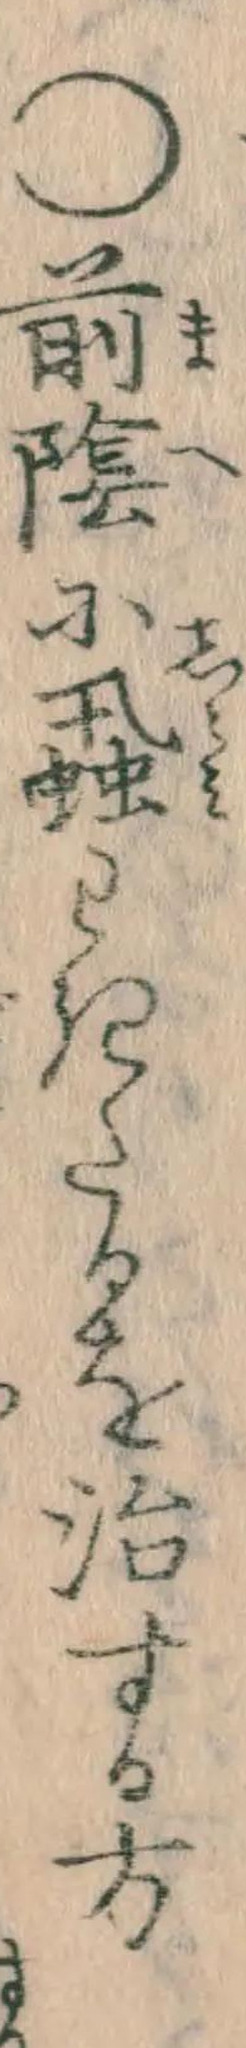○前陰に蝨わきたるを治する方
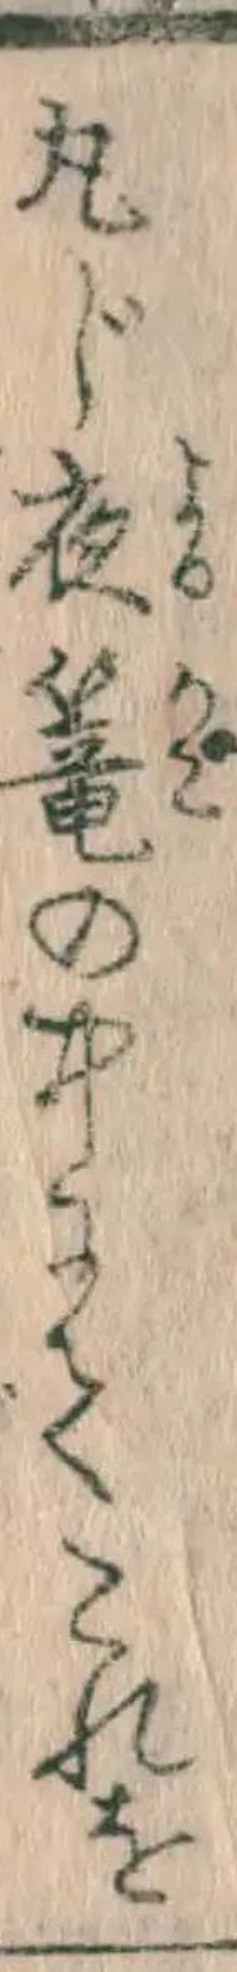丸じ夜籠の中にてこれを
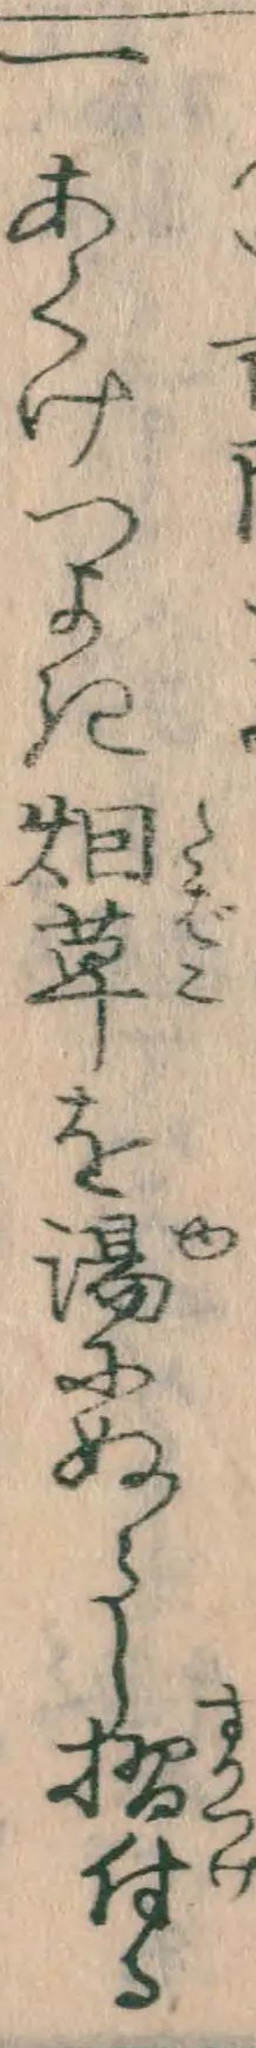一あくけつよき煙草を湯にぬらし摺付る
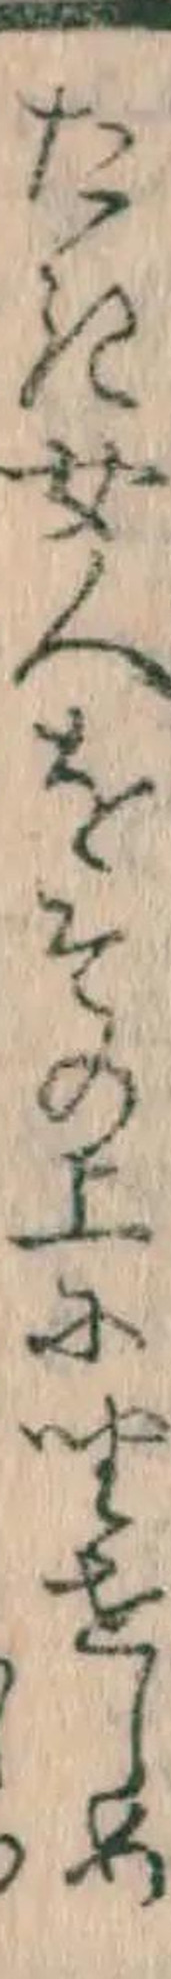たき女人をその上に坐せしめ
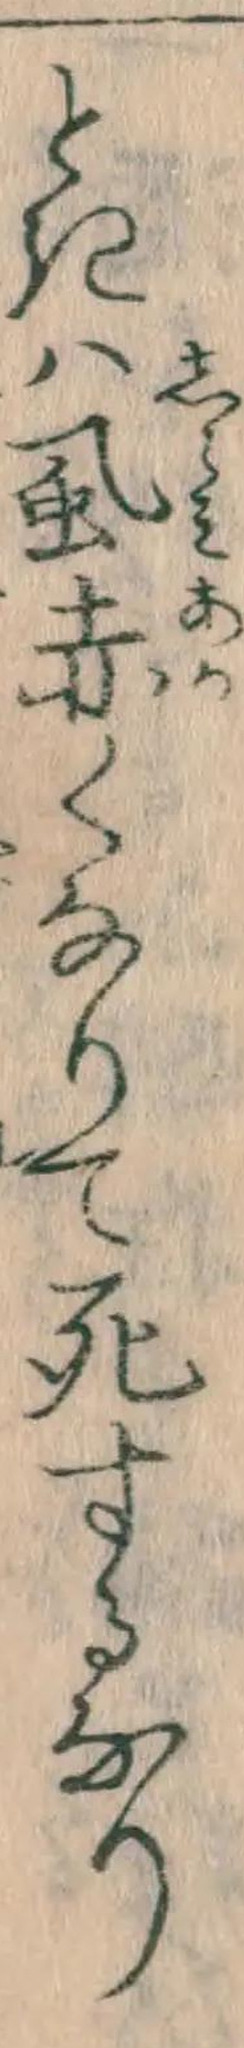ときは蝨赤くなりて死するなり
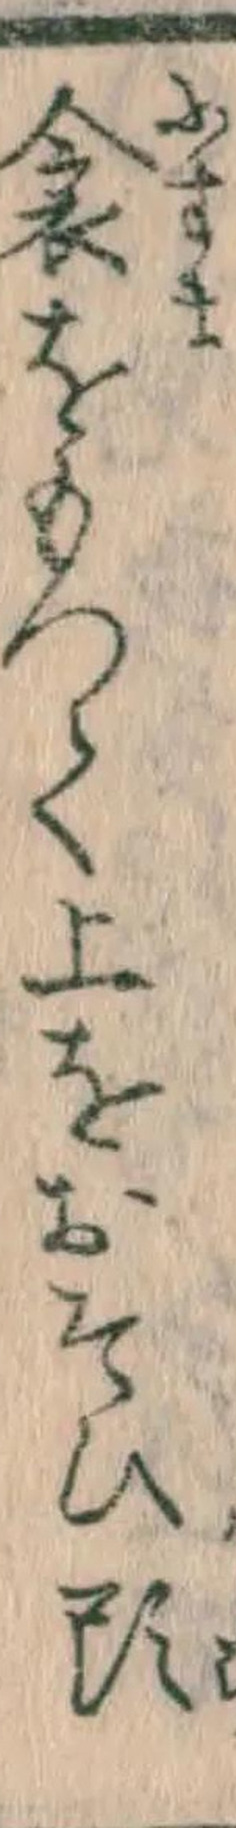衾をもつて上をおそひ頭
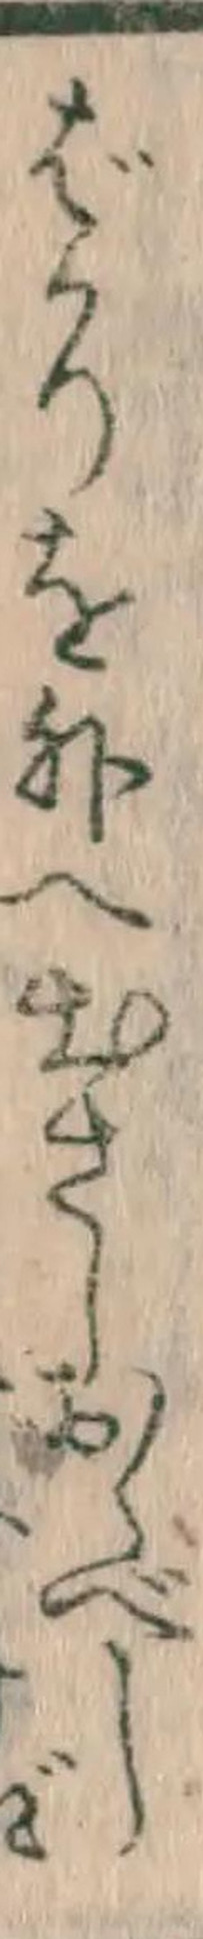ばかりを外へ出さしおくべし
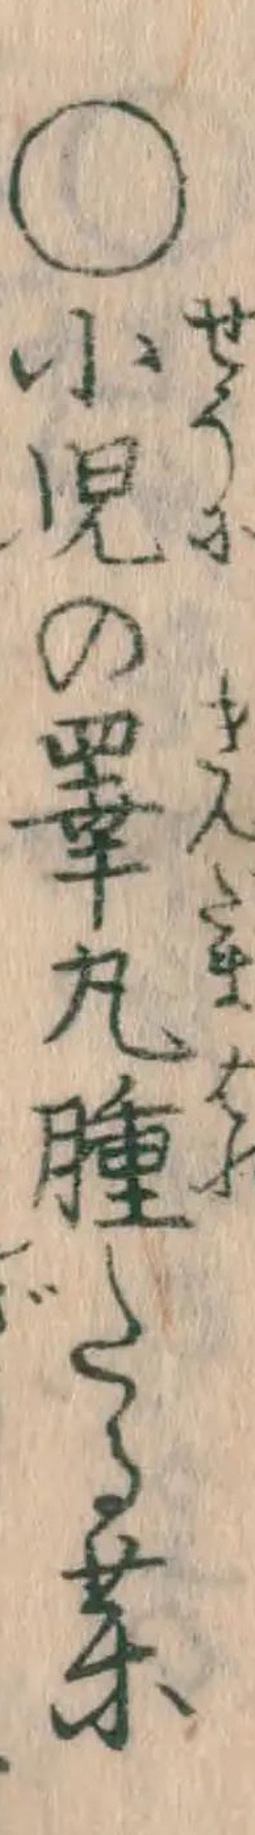○小児の睪丸腫たる薬
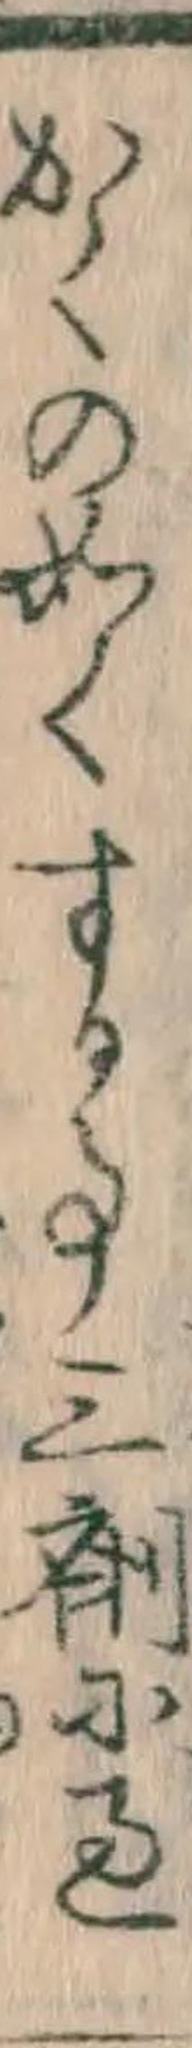かくの如くする事三剤に過
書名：広益秘事大全 3巻. [4]
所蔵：国立国会図書館 National Diet Library, JAPAN
